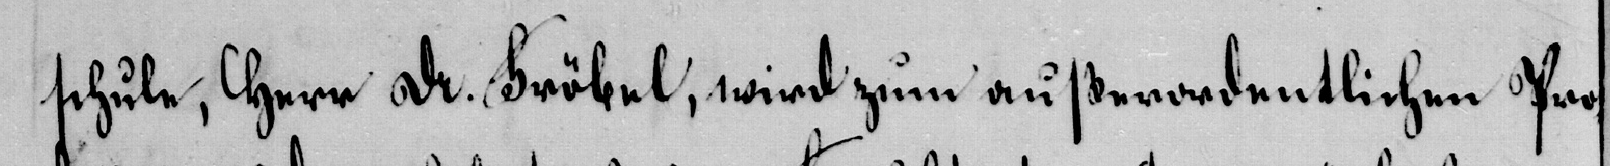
schule, Herr Dr. Fröbel, wird zum außerordentlichen Pro¬
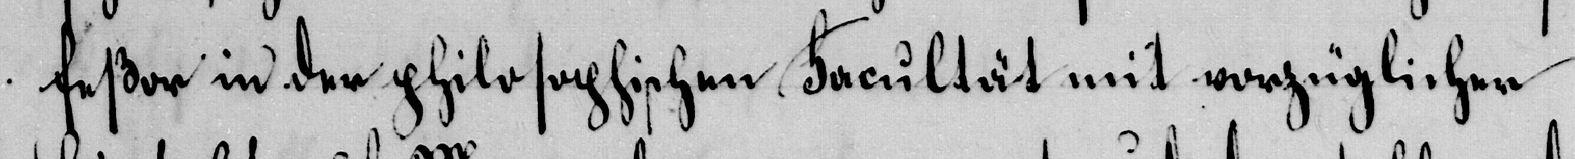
feßor in der philosophischen Facultät mit vorzüglicher
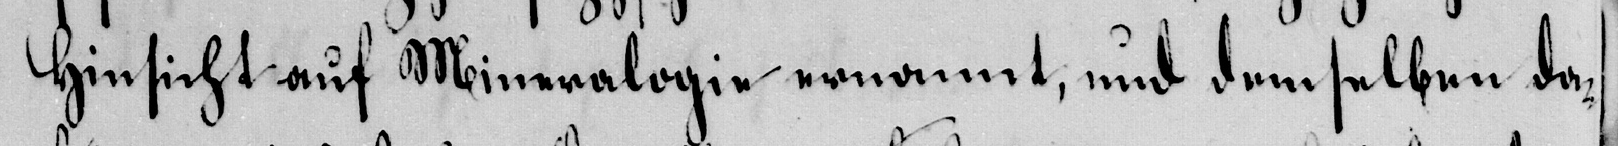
Hinsicht auf Mineralogie ernannt, und demselben da¬
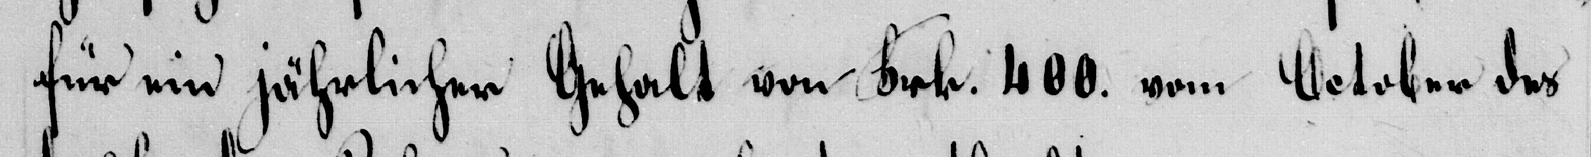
für ein jährlicher Gehalt von Frk. 400. vom October des
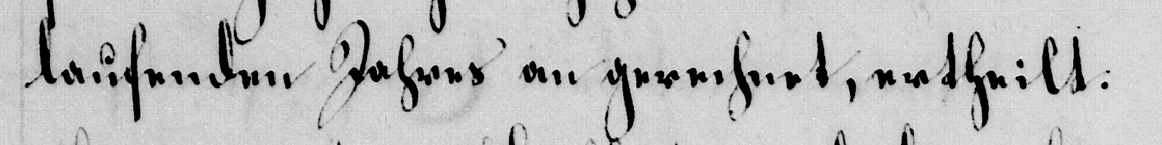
laufenden Jahres an gerechnet, ertheilt.
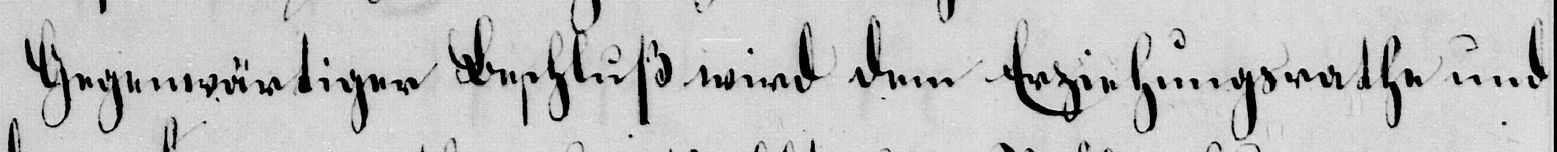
Gegenwärtiger Beschluß wird dem Erziehungsrathe und
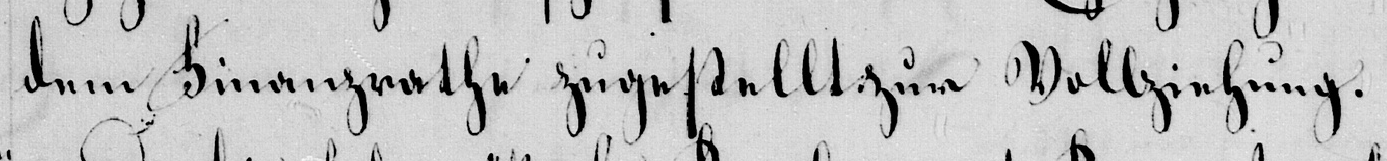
dem Finanzrathe zugestellt zur Vollziehung.
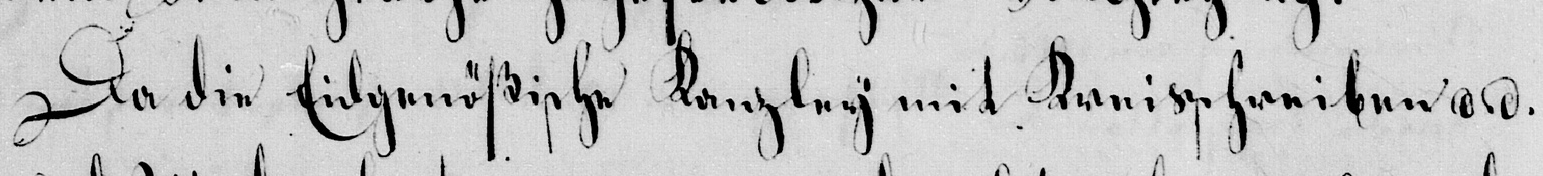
Da die Eidgenößische Kanzley mit Kreisschreiben d. d.
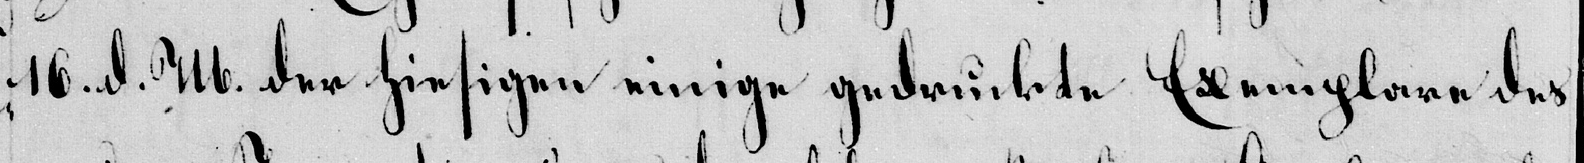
16. d. M. der hiesigen einige gedruckte Exemplare des
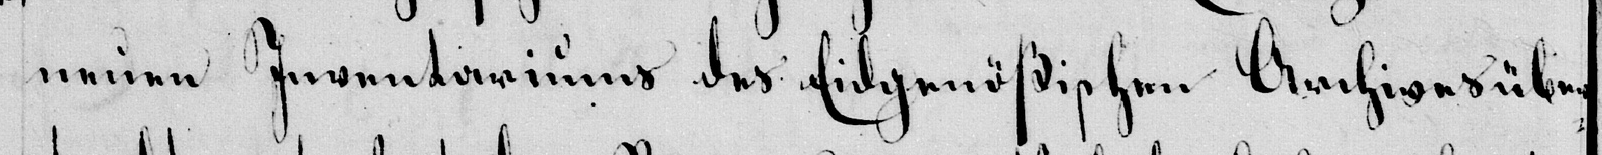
neuen Inventariums des Eidgenößischen Archivs über¬
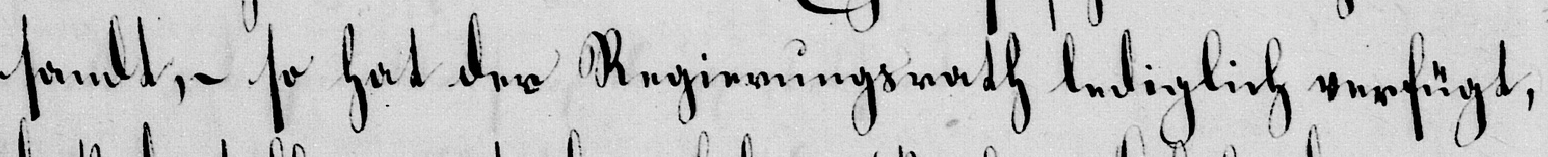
sandt, – so hat der Regierungsrath lediglich verfügt,
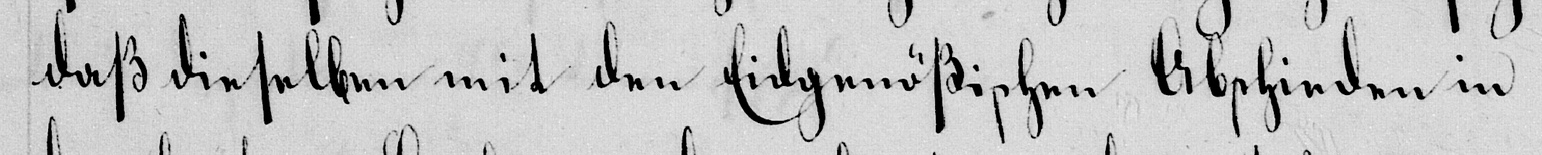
daß dieselben mit den Eidgenößischen Abschieden in
